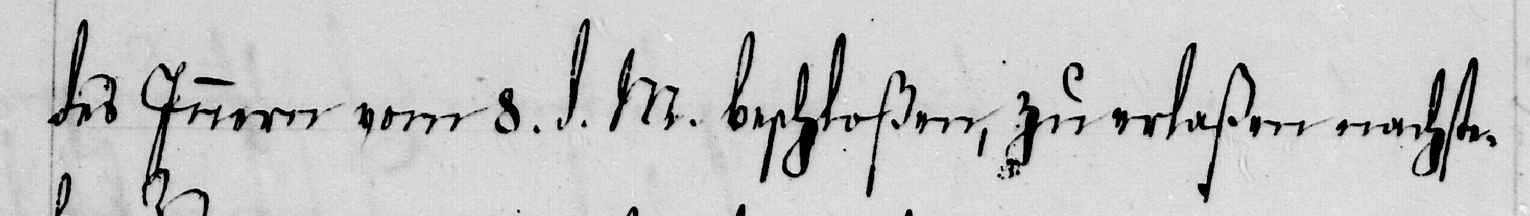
des Innern vom 8. d. M. beschloßen, zu erlaßen nachste¬
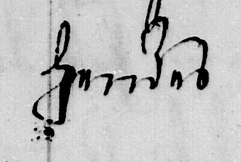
hendes
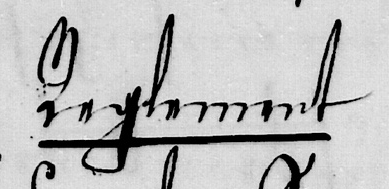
Reglement
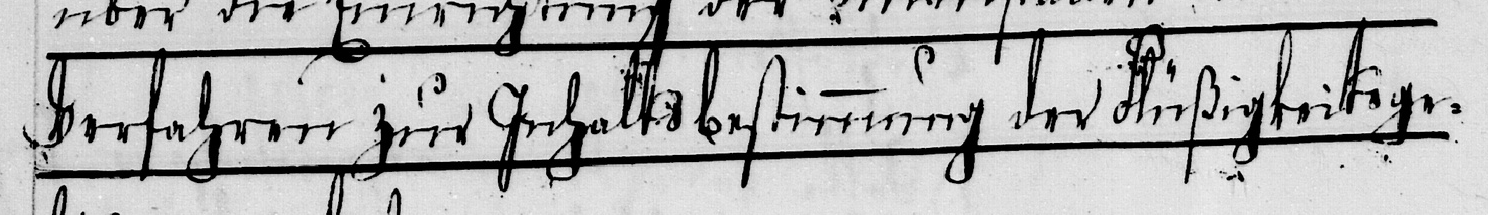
Verfahren zur Inhaltsbestimmung der Flüßigkeitsge¬
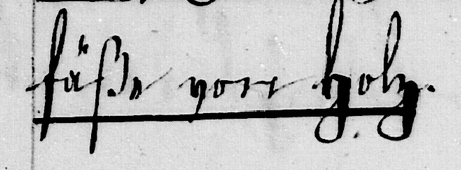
fäße von Holz.
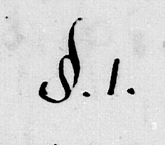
§. 1
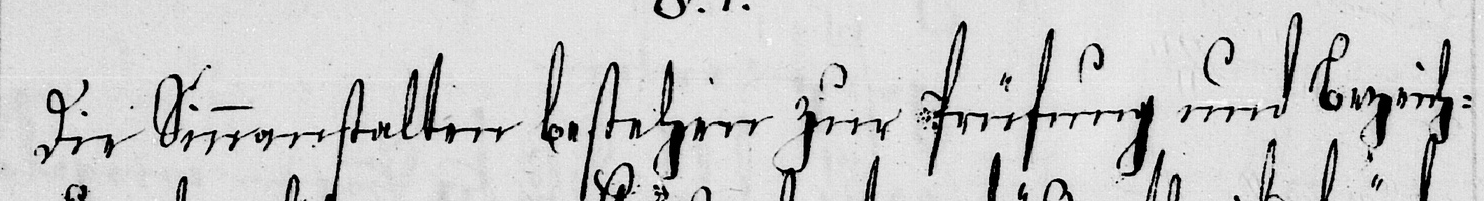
Die Sinnanstalten bestehen zur Prüfung und Bezeic¬
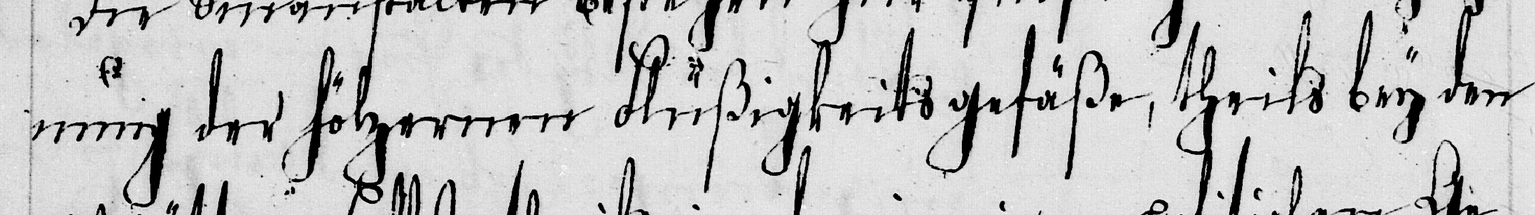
hnung der hölzernen Flüßigkeitsgefäße, theils bey den
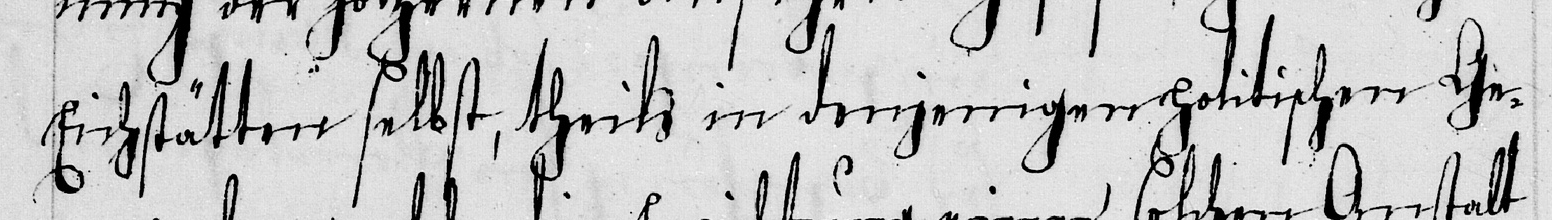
Eichstätten selbst, theils in denjenigen politischen Ge¬
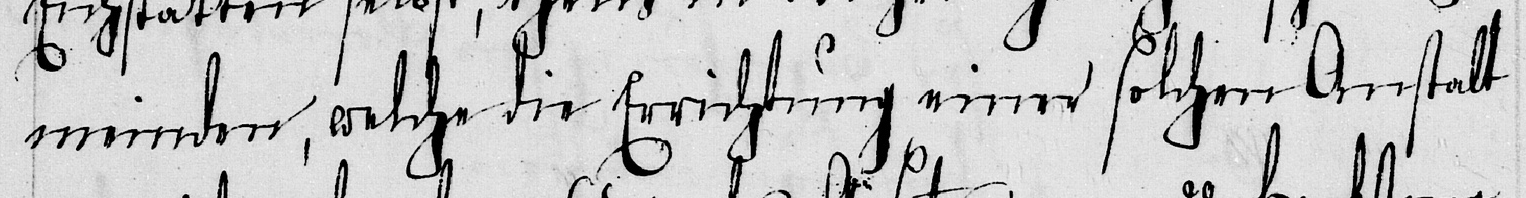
meinden, welche die Errichtung einer solchen Anstalt
